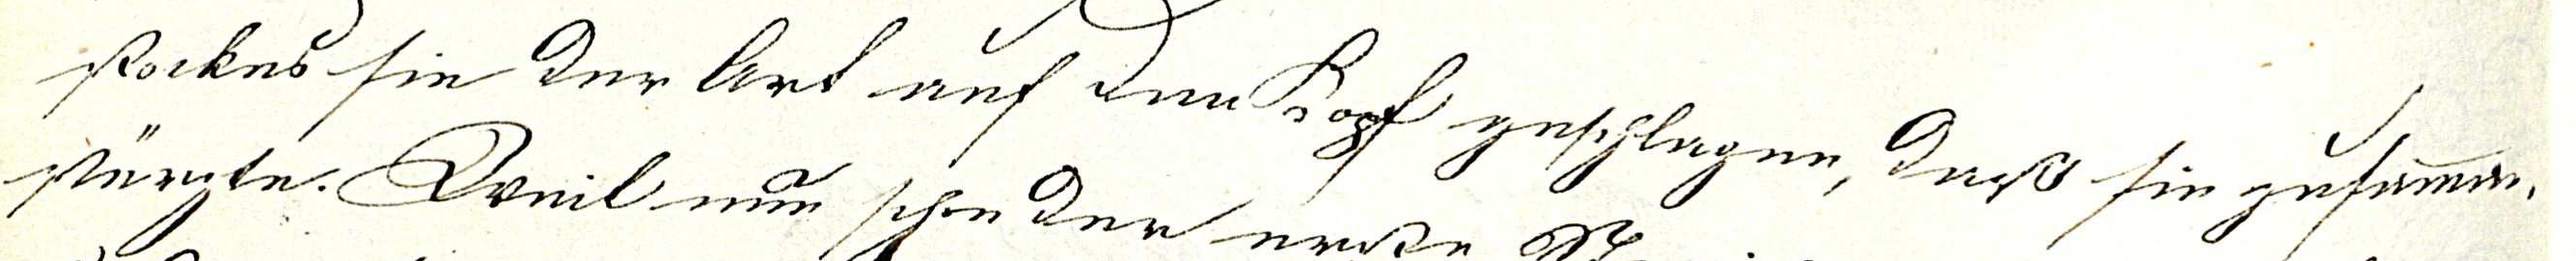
stockes sie der Art auf den Kopf geschlagen, daß sie zusammen¬
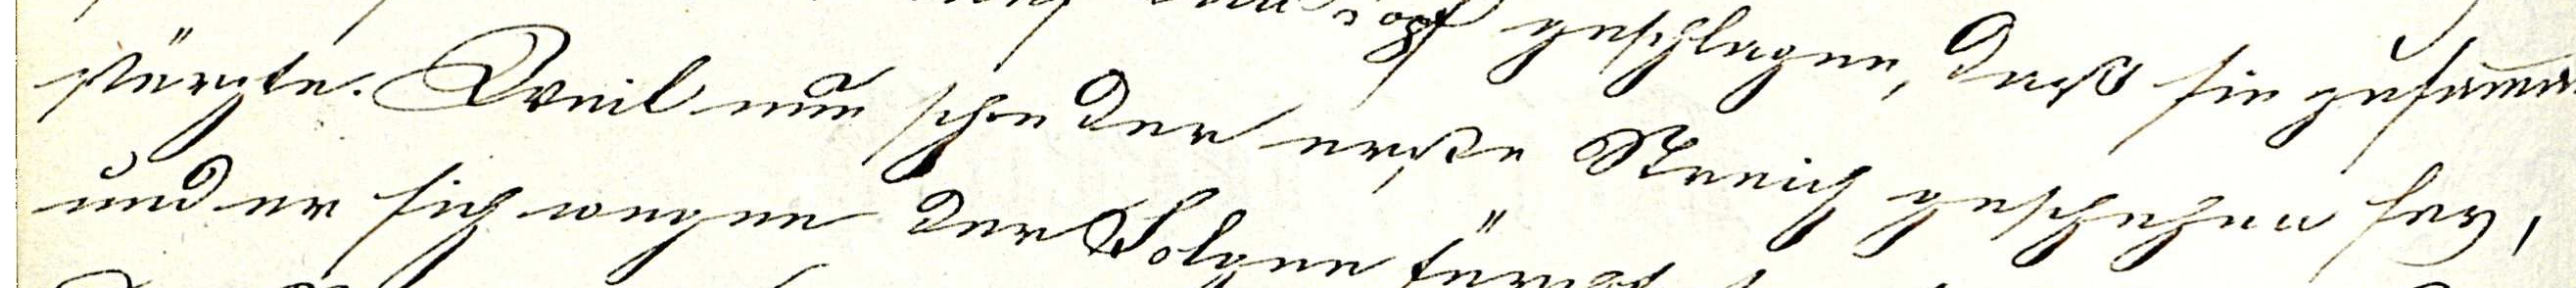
stürzte. Weil nun schon der erste Streich geschehen sey,
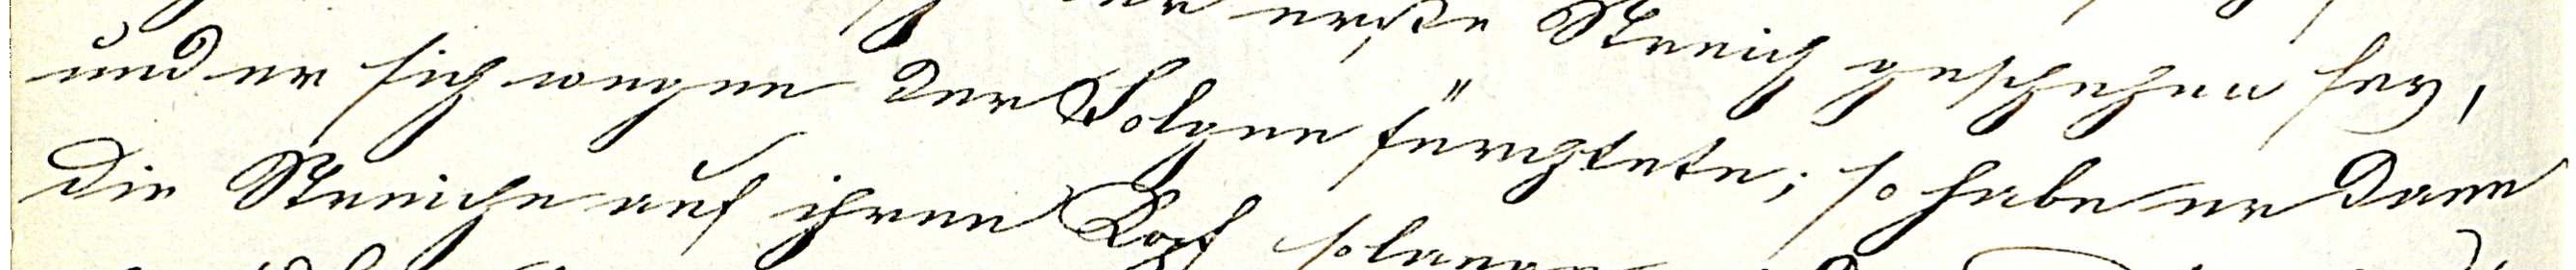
und er sich wegen der Folgen fürchtete; so habe er dann
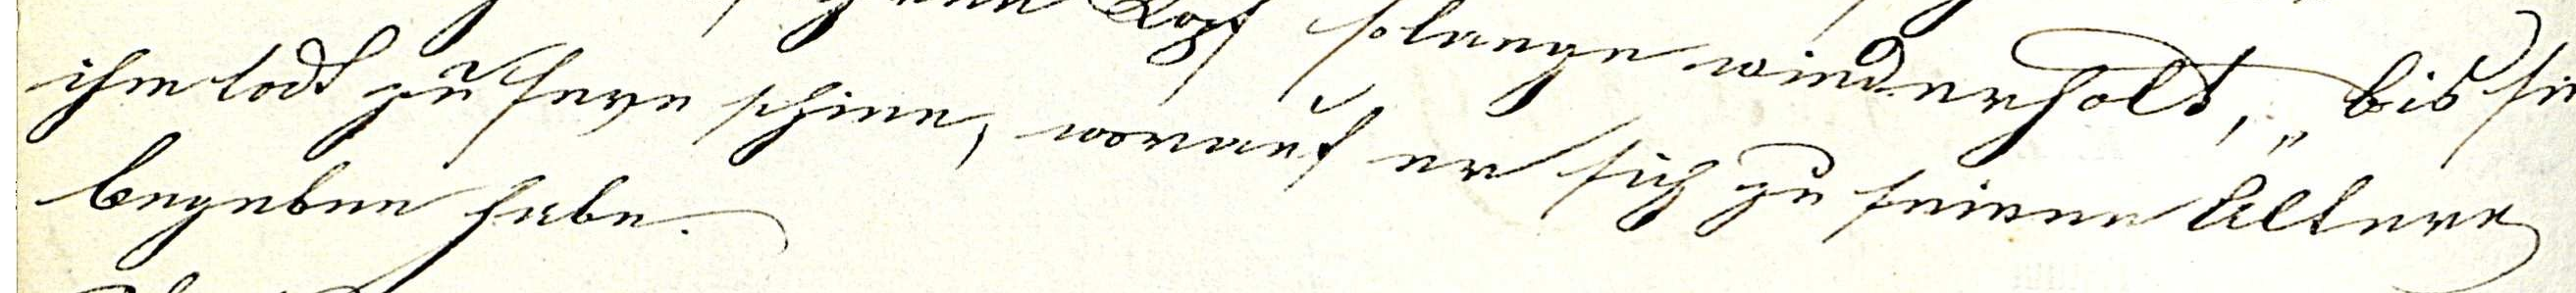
die Streiche auf ihren Kopf solange widerholt, bis sie
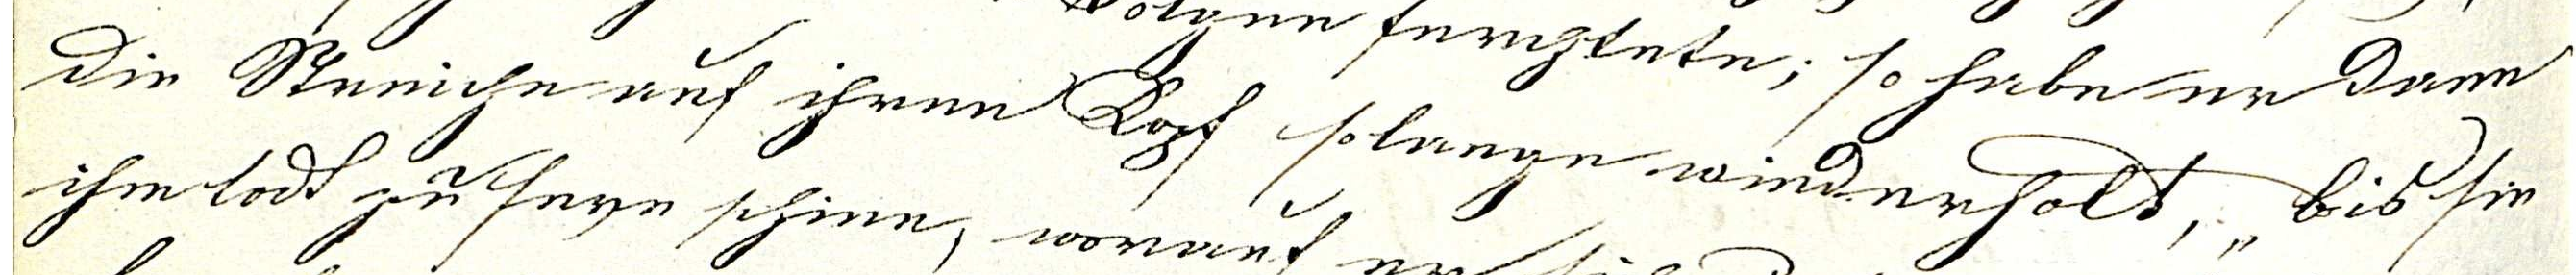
ihm todt zu seyn schien, worauf er sich zu seinen Ältern
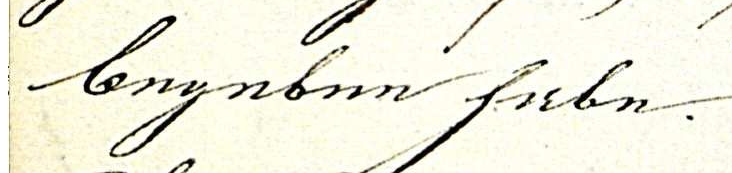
begeben habe.
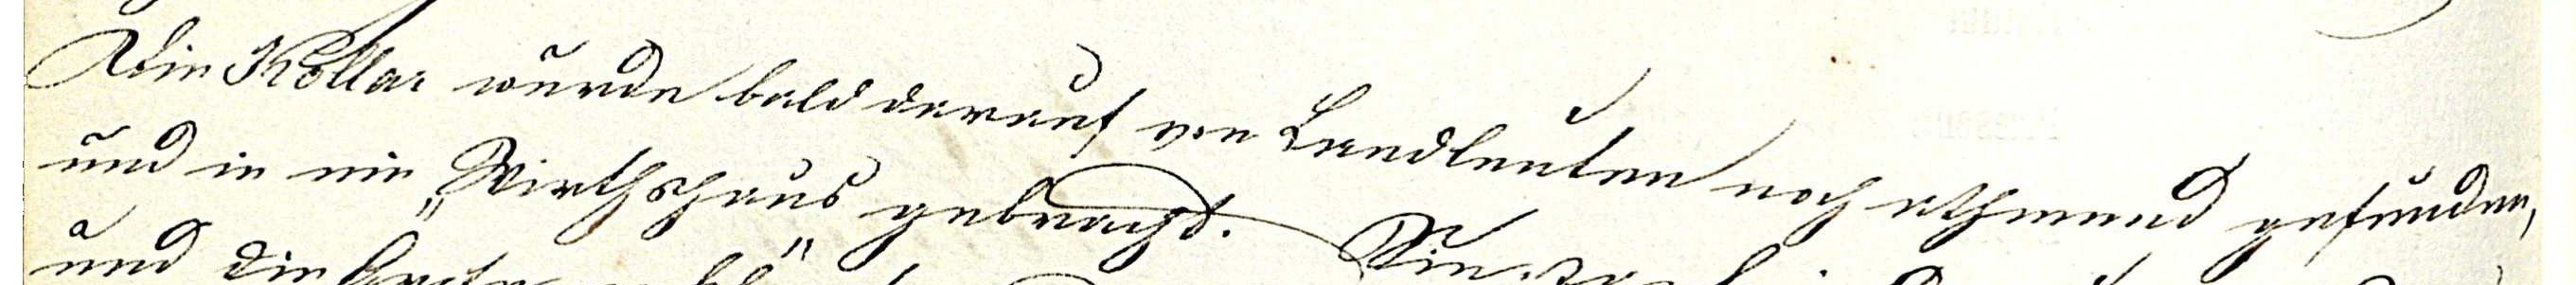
Die Kollar wurde bald darauf von Landleuten noch athmend gefunden,
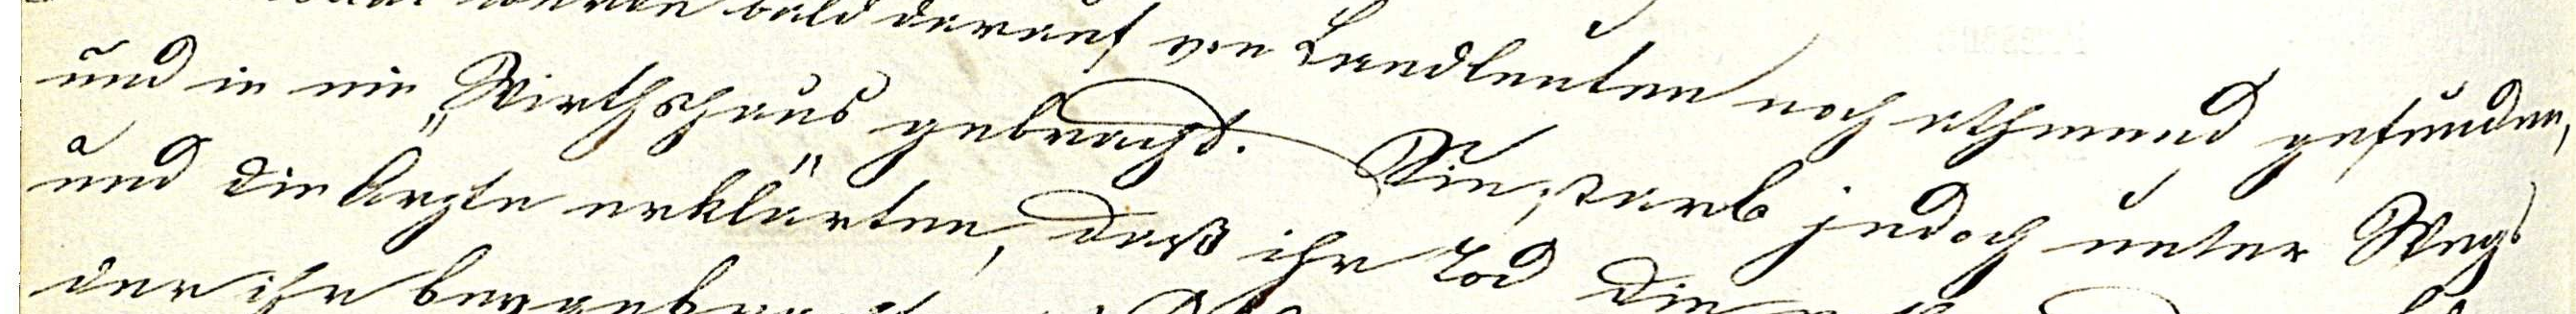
und in ein Wirthshaus gebracht. Sie starb jedoch unter Wegs
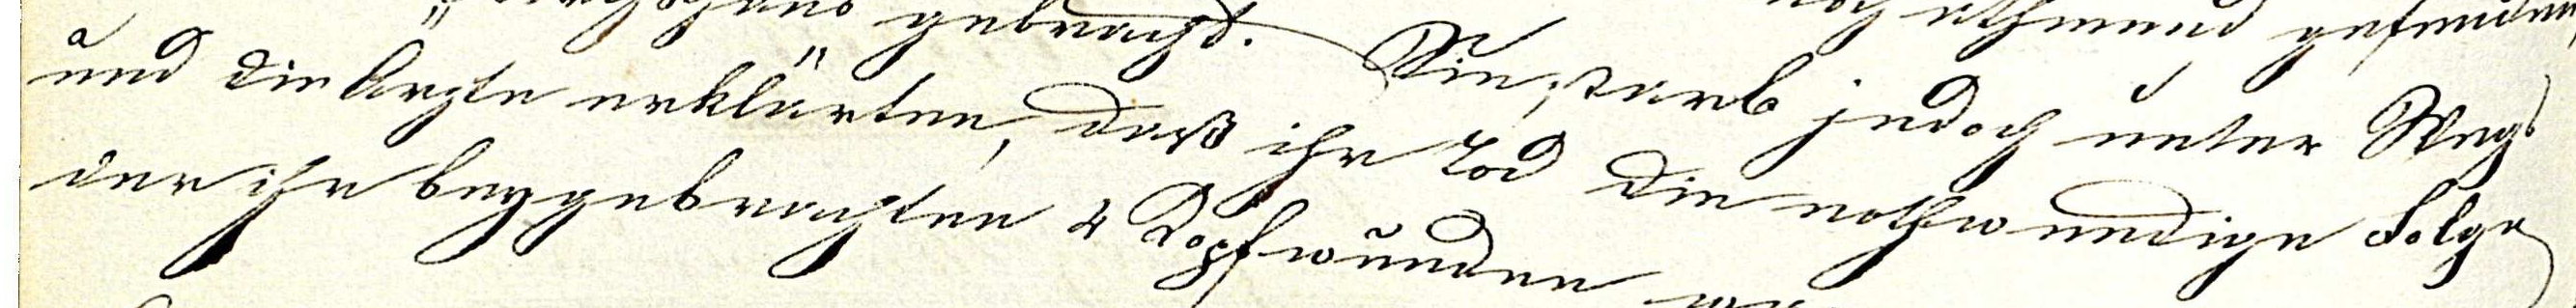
und die Ärzte erklärten, daß ihr Tod die nothwendige Folge
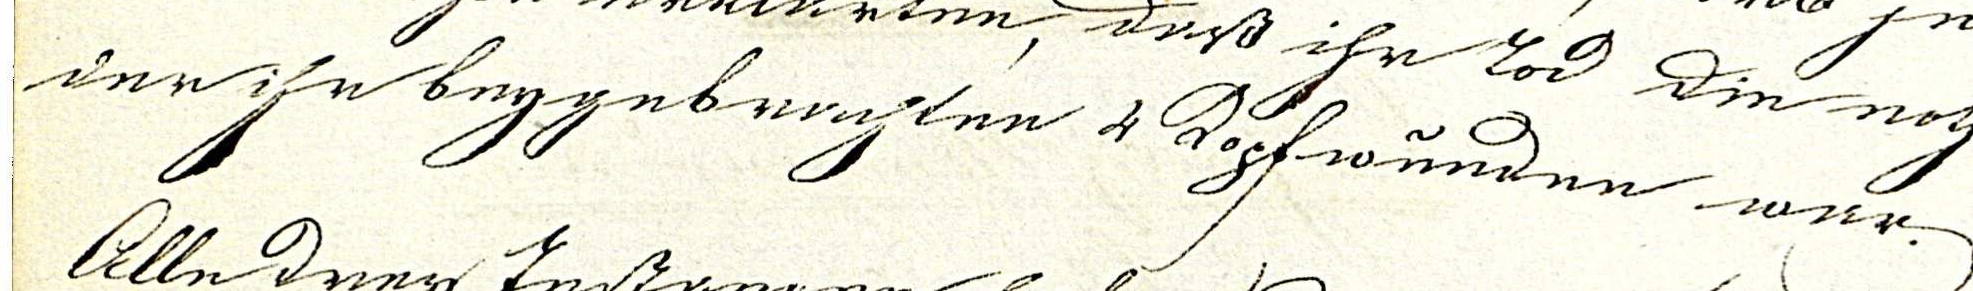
der ihr beygebrachten 4 Kopfwunden war.
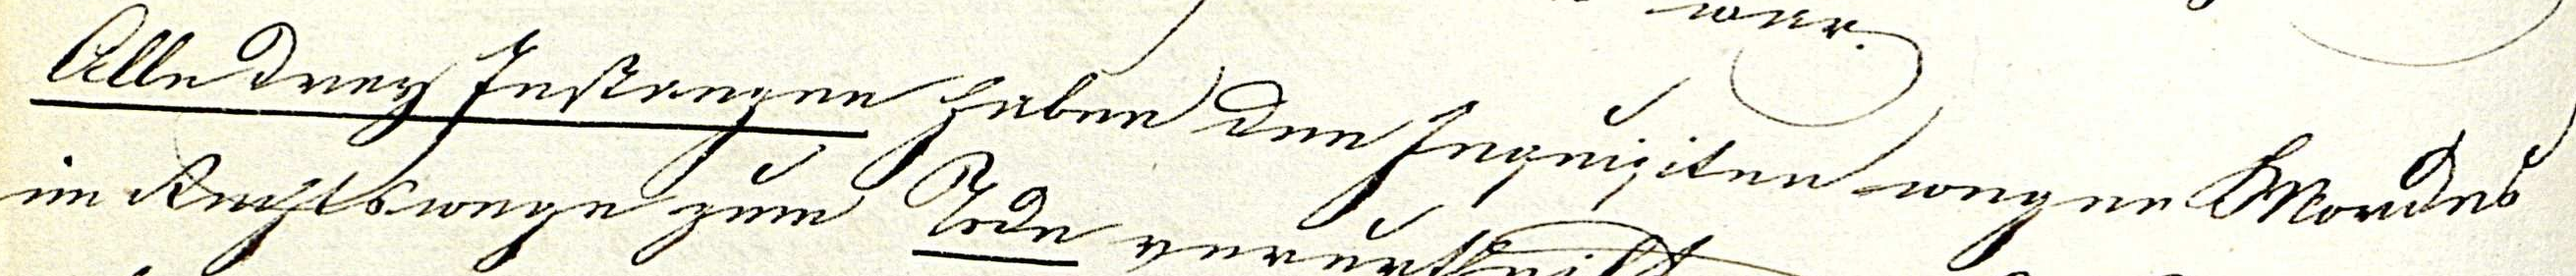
Alle drey Instanzen haben den Inquisiten wegen Mordes
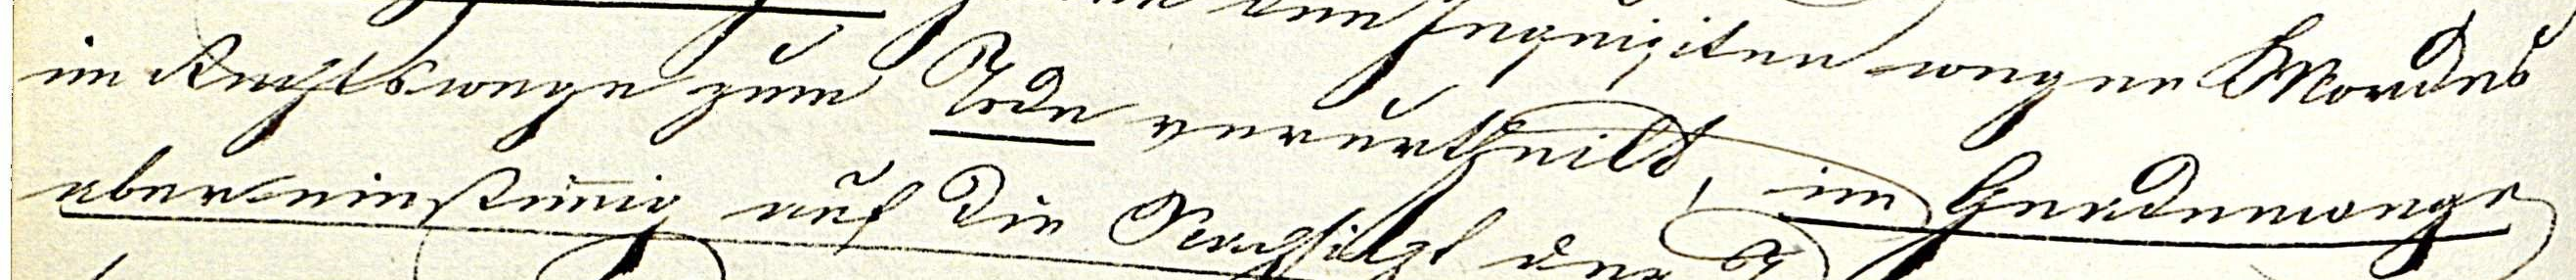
im Rechtswege zum Tode verurtheilt, im Gnadenwege
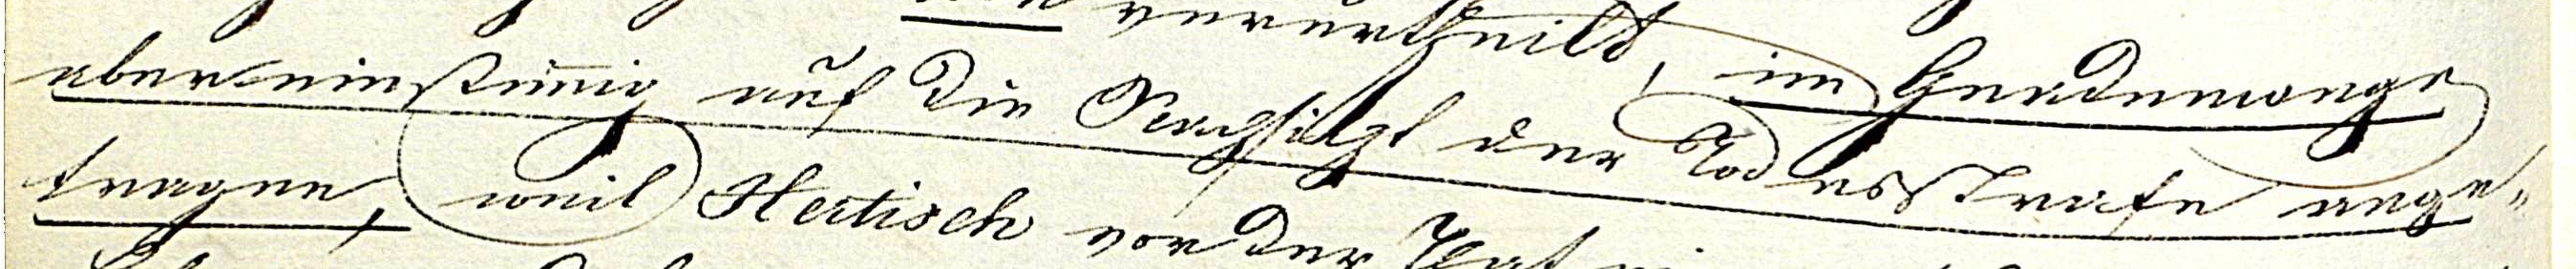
aber einstimmig auf die Nachsicht der Todesstrafe ange¬
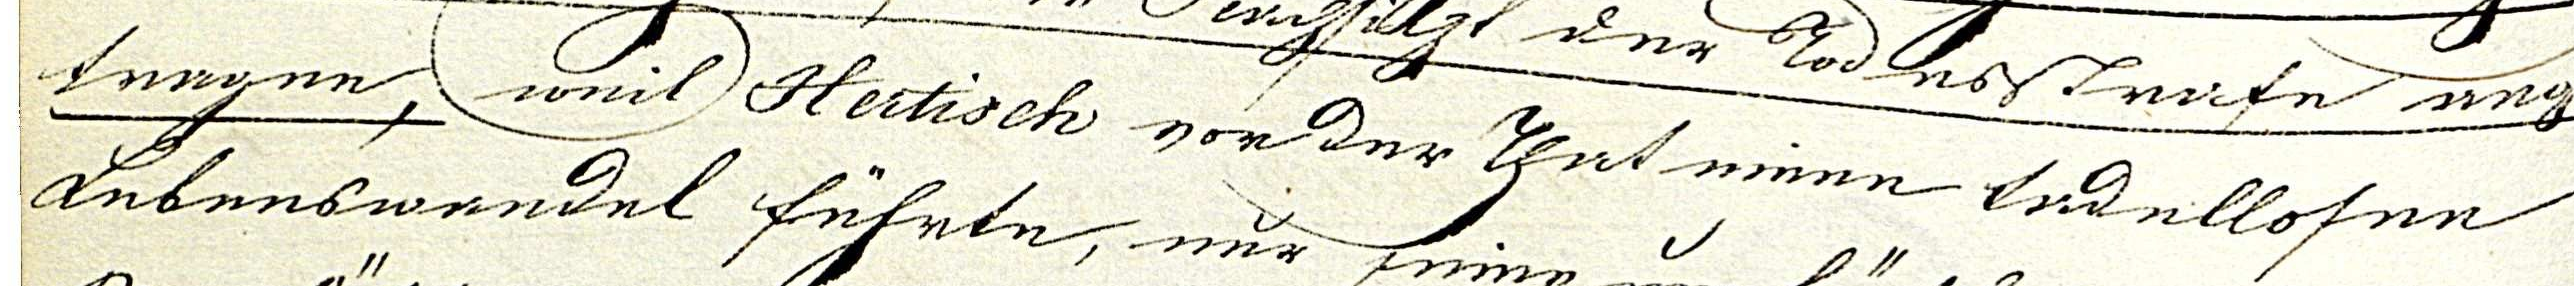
tragen, weil Hertisch vor der That einen tadellosen
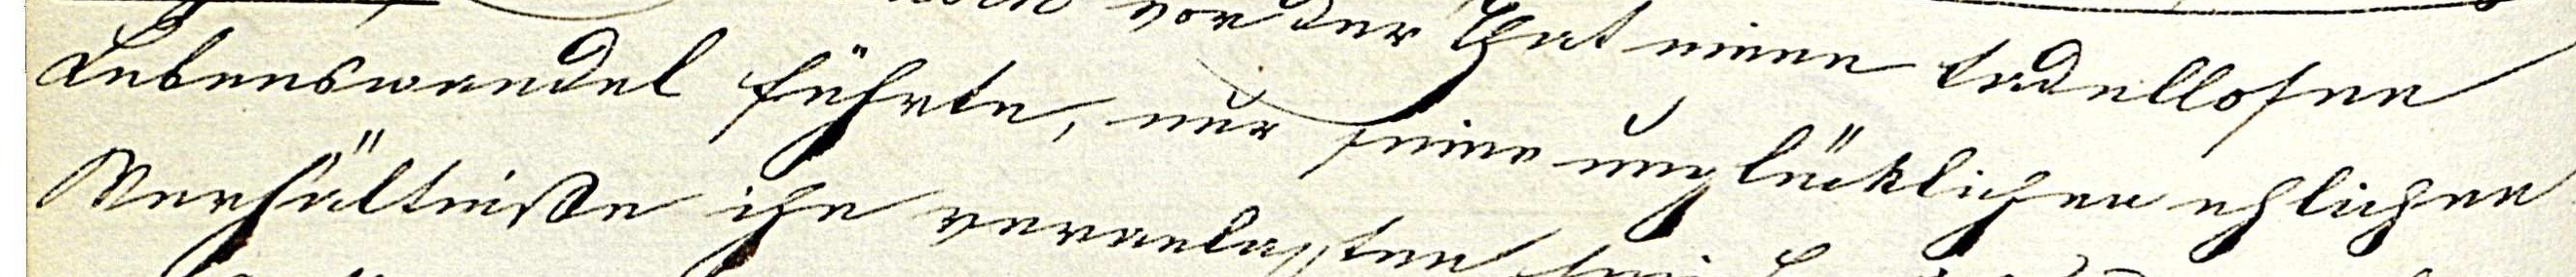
Lebenswandel führte, nur seine unglücklichen ehlichen
